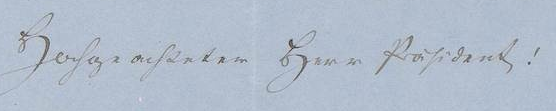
Hochgeachteter Herr Präsident!
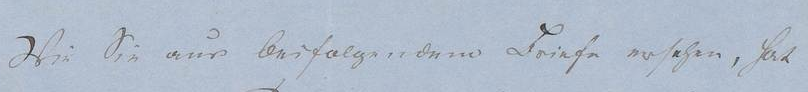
Wie Sie aus beifolgendem Briefe ersehen, hat
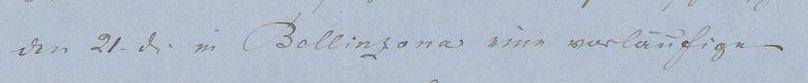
den 21. d. in Bellinzona eine vorläufige
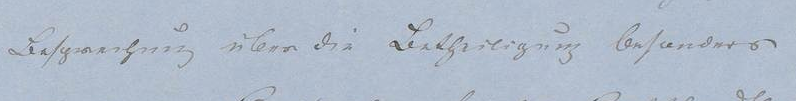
Besprechung über die Betheiligung besonders
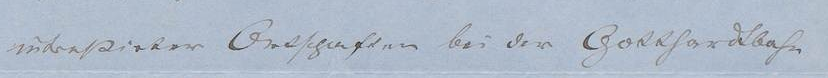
intreßirter Ortschaften bei der Gotthardtbahn
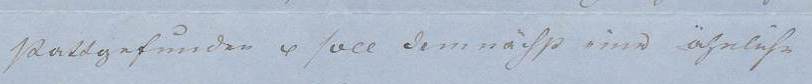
stattgefunden & soll demnächst eine ähnliche
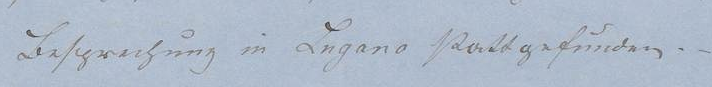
Besprechung in Lugano stattgefunden. –
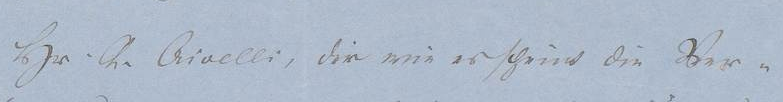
Hr. Ch.Crivelli, der wie es scheint die Ver-
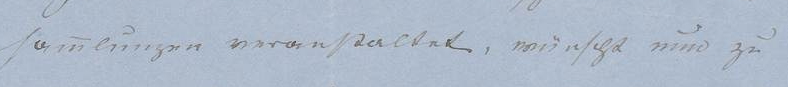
sammlungen veranstaltet, wünscht nun zu
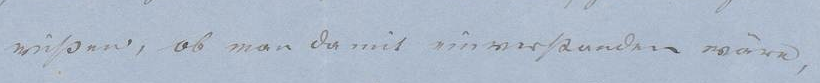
wißen, ob man damit einverstanden wäre,
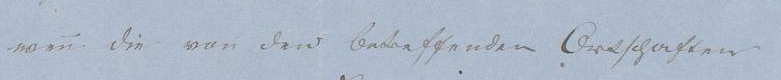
wenn die von den betreffenden Ortschaften
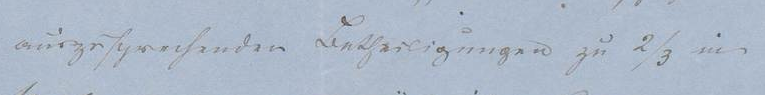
auszusprechenden Betheiligungen zu ⅔ in
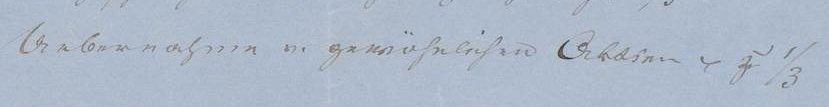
Uebernahme v. gewöhnlichen Aktien & zu ⅓
